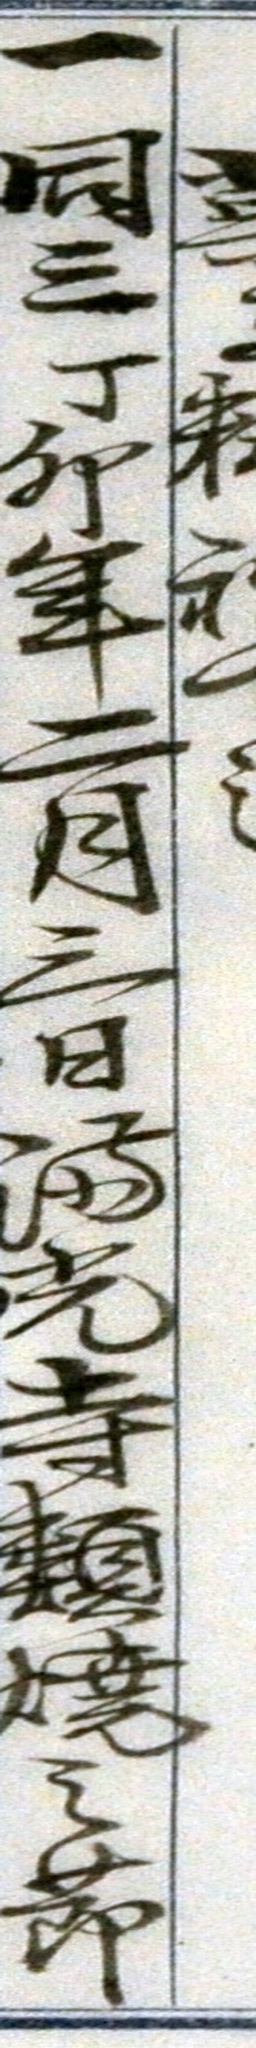一同三丁卯年二月三日満光寺類焼之節
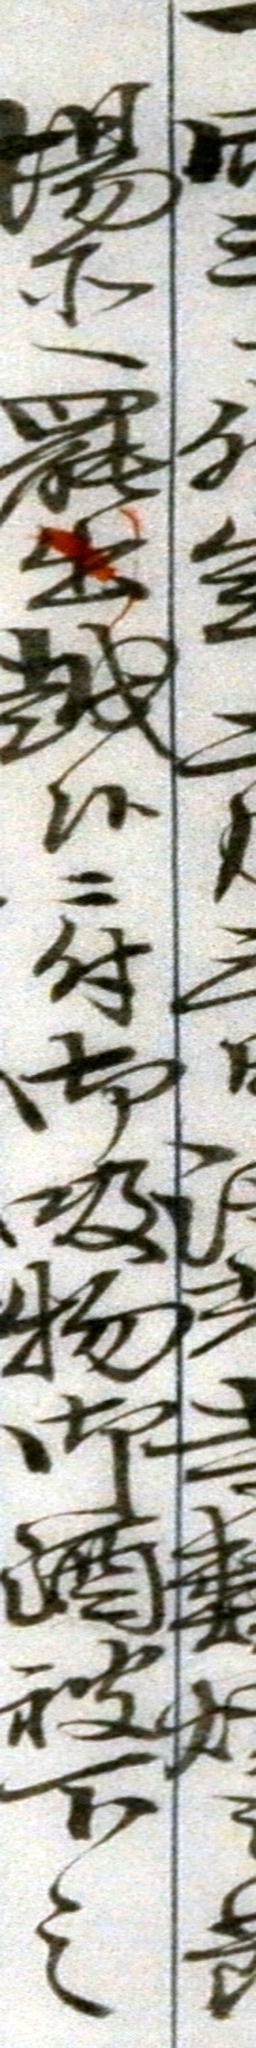場所へ罷越候ニ付御吸物御酒被下之
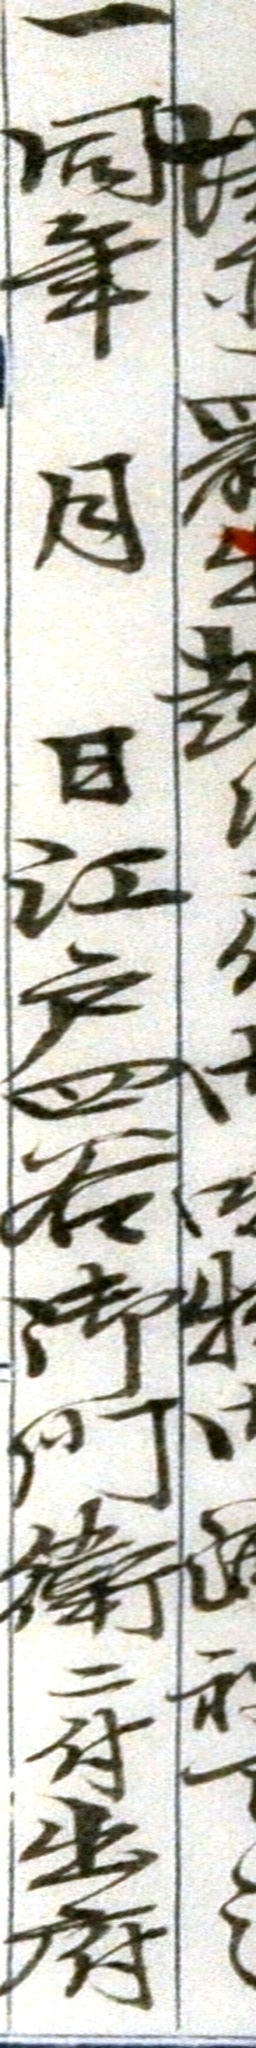一同年月日江戸四谷御門衛ニ付出府

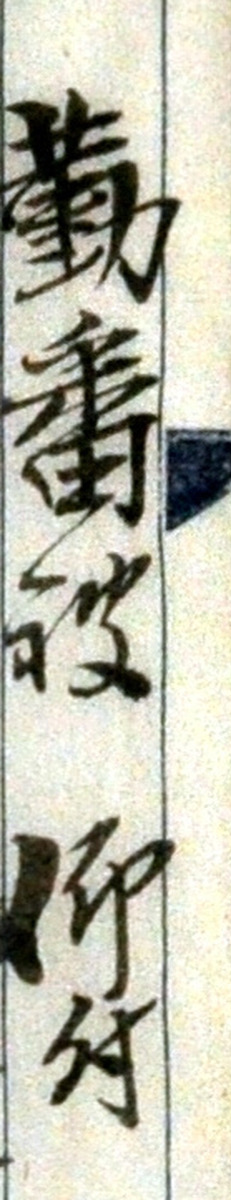勤番被仰付
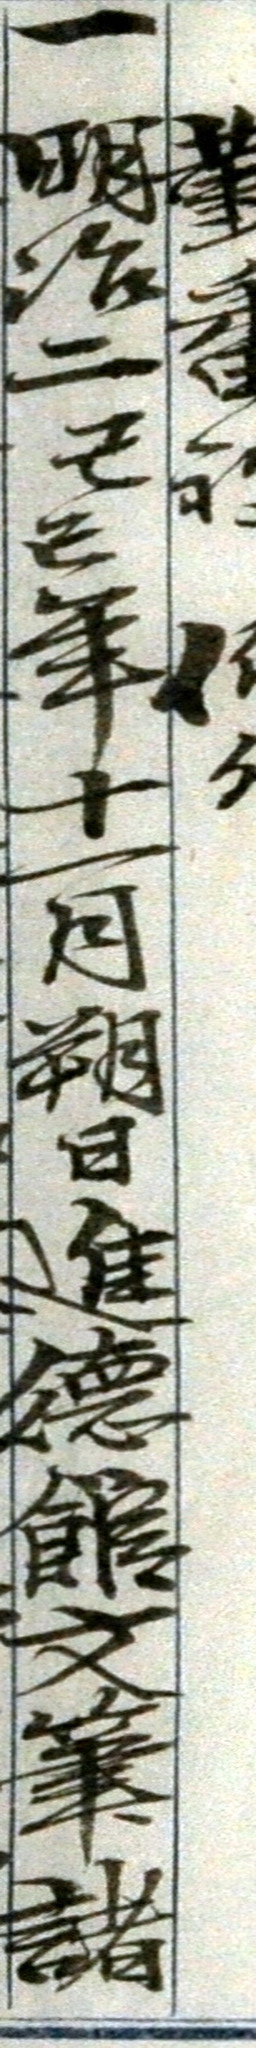一明治二己巳年十一月朔日進徳館文筆諸
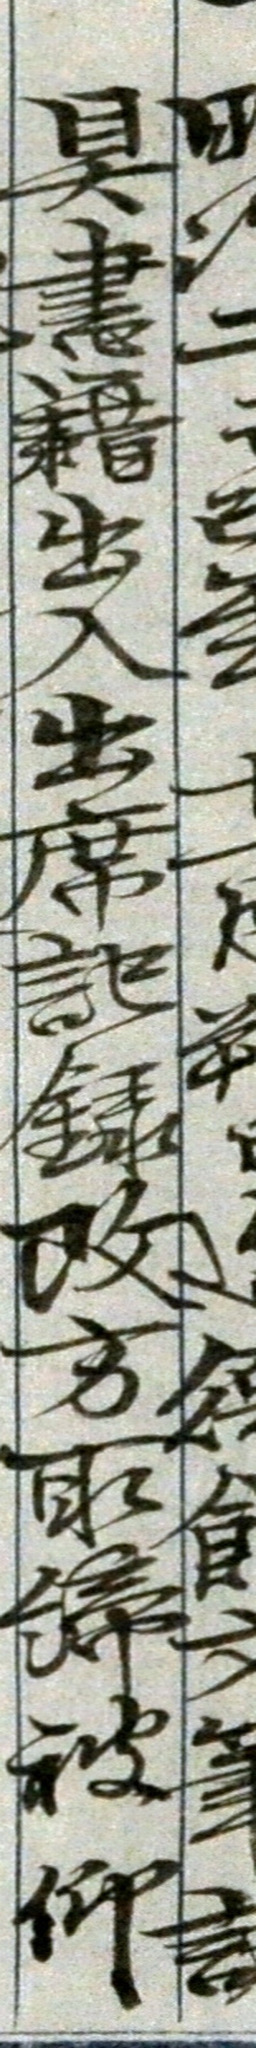具書籍出入出席記録改方取締被仰
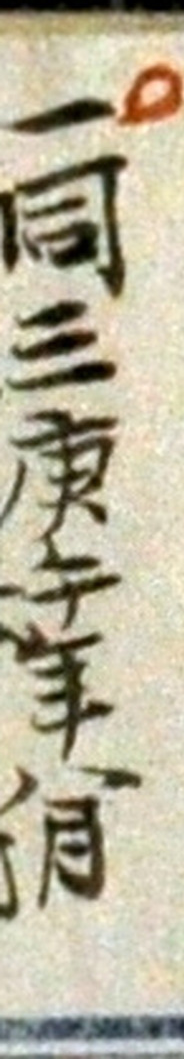一同三庚午年八月
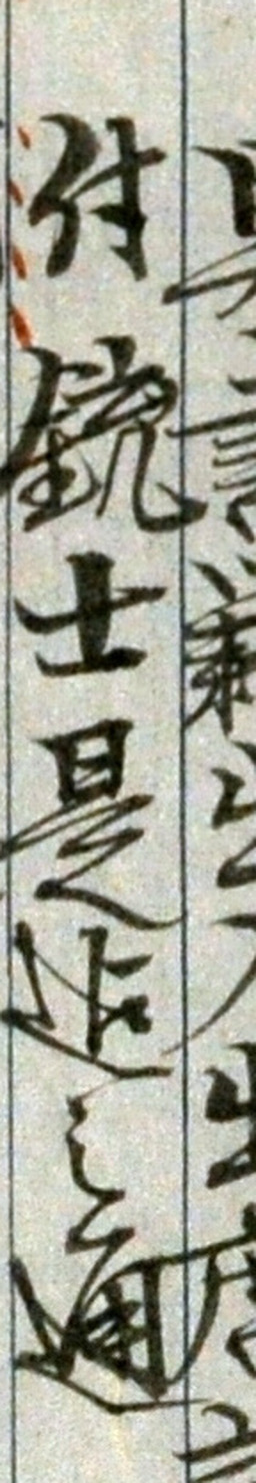付銃士是迄之通
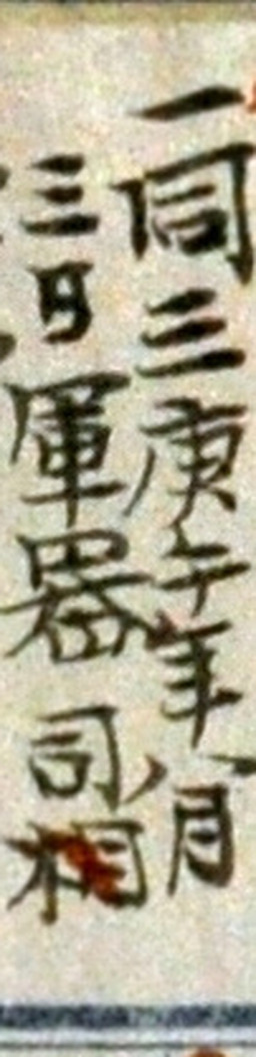三日軍器司
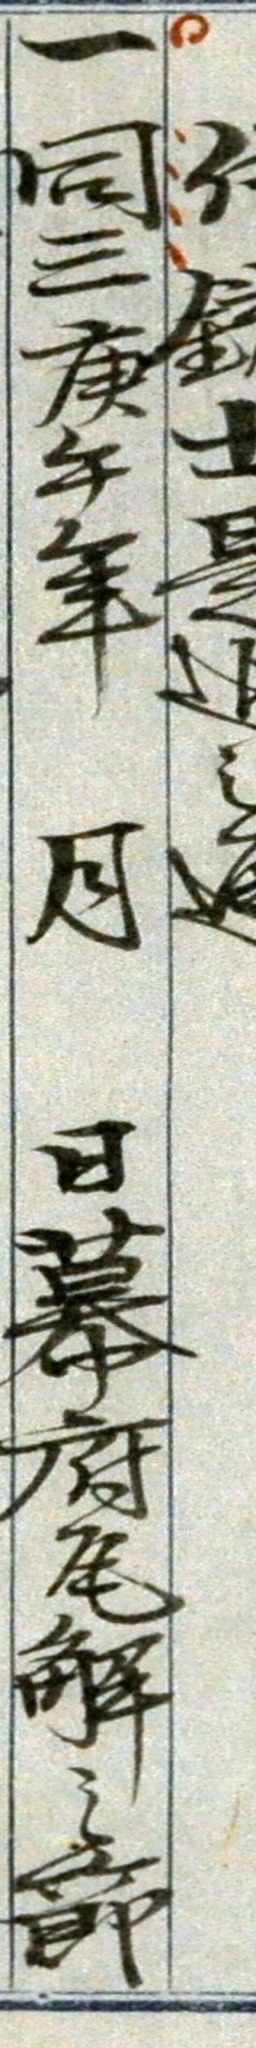一同三庚午年月日幕府瓦解之節
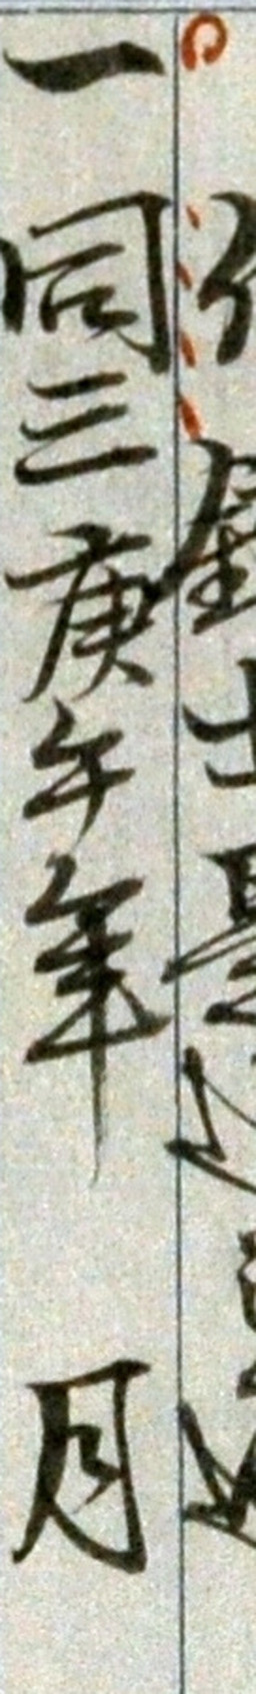一同三庚午年八月
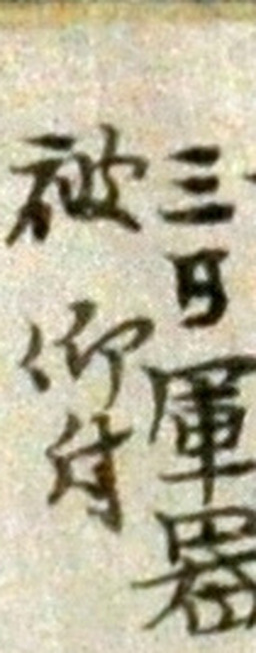被仰付
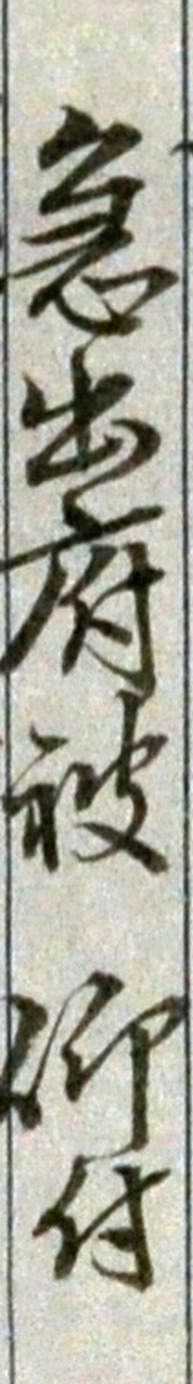急出府被仰付
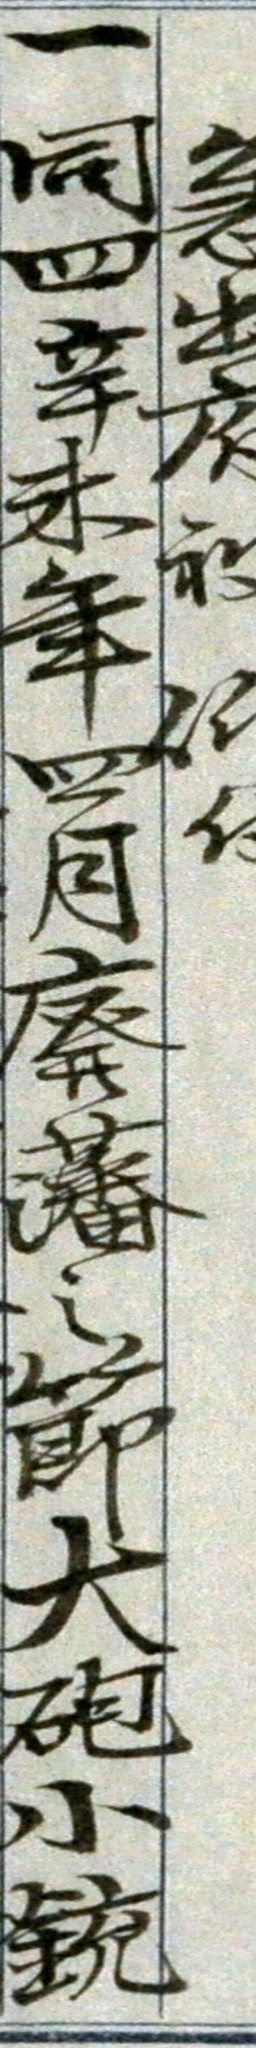一同四辛未年四月廃藩之節大砲小銃
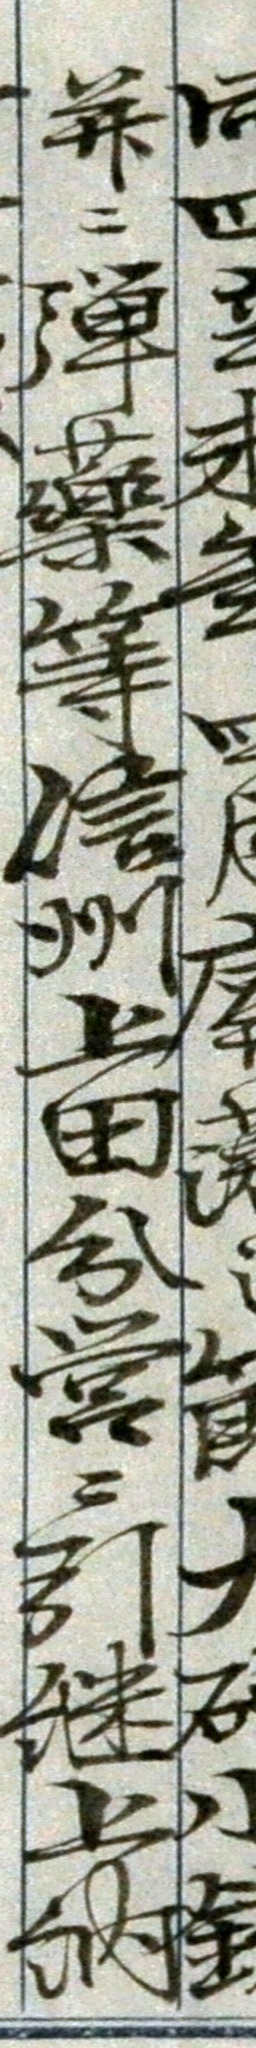并ニ弾薬等信州上田分営ニ引継上納
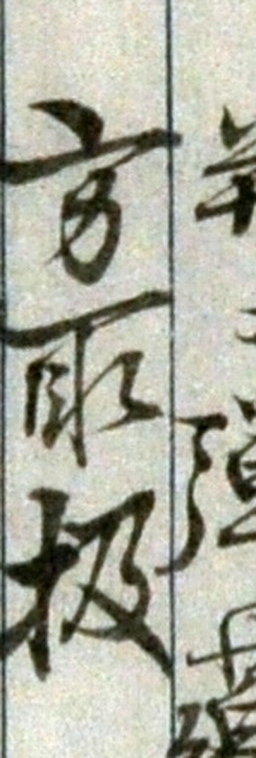方取扱
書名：三好氏先代以来勤仕録、池田丈介一家勤仕録
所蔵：伊那市立高遠町図書館・合同会社AMANE
